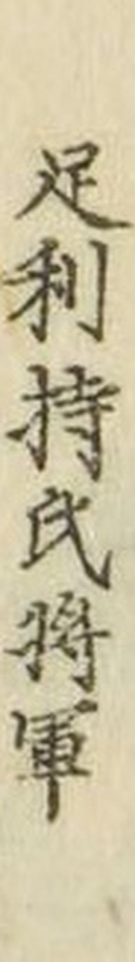足利持氏将軍
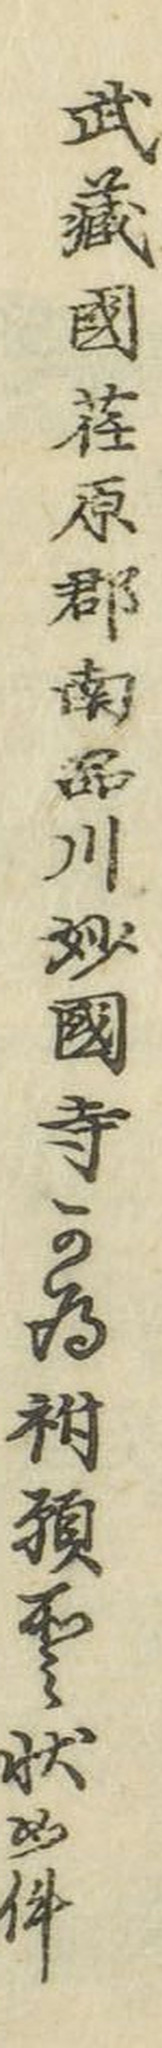武藏國荏原郡南品川妙國寺可為願所之状如件
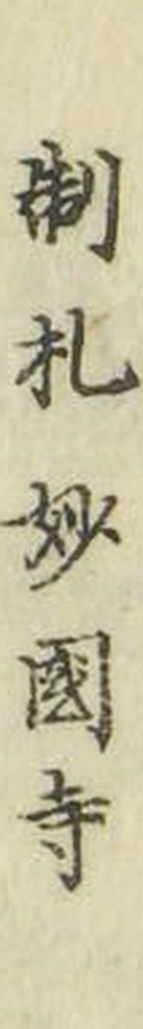制札妙國寺
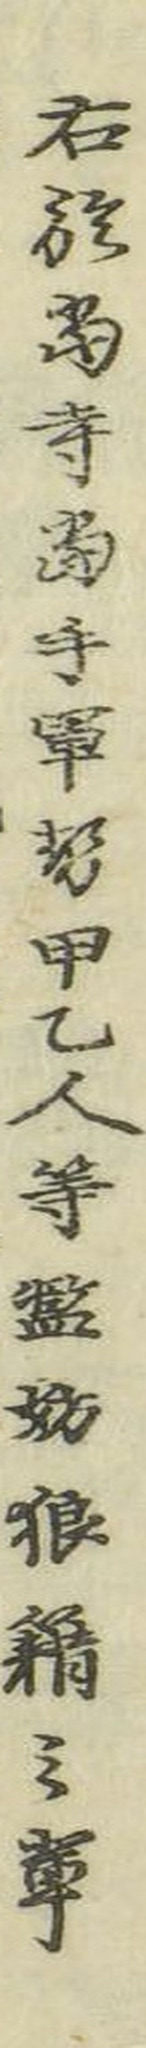右於當寺當手軍勢声乙人等濫妨狼藉之軰
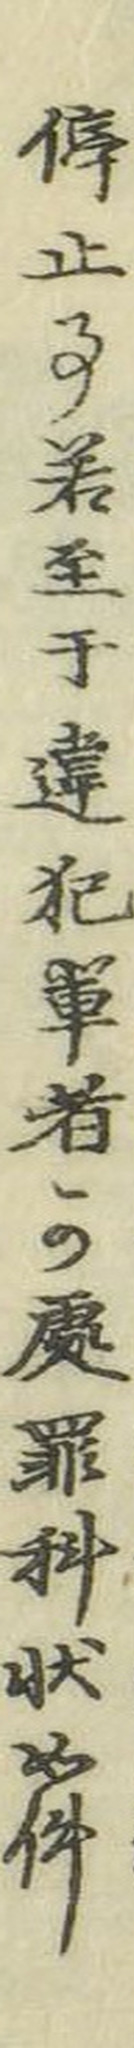停止事若至于違犯軰者可處罪科状如件

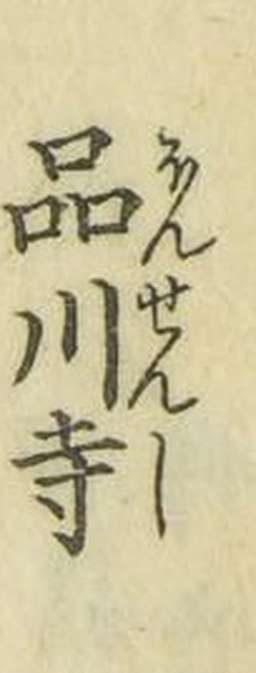品川寺

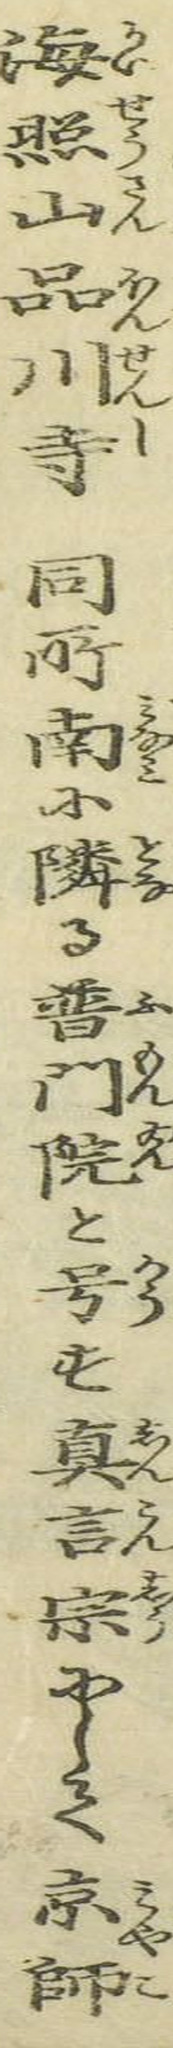海照山品川寺同所南に隣る普門院と号す真言宗にして京師
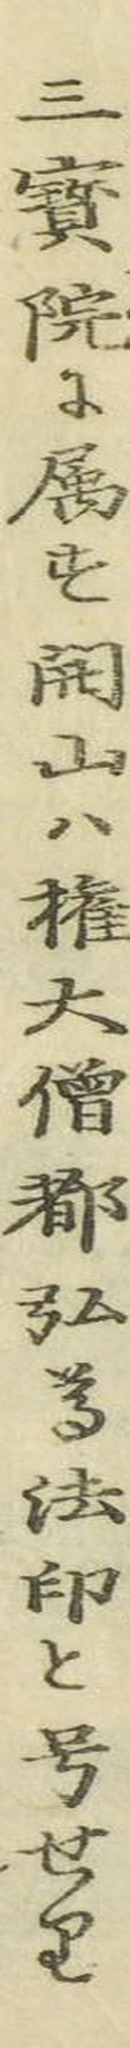三寳院に属す開山は権大僧都弘尊法印と号せり
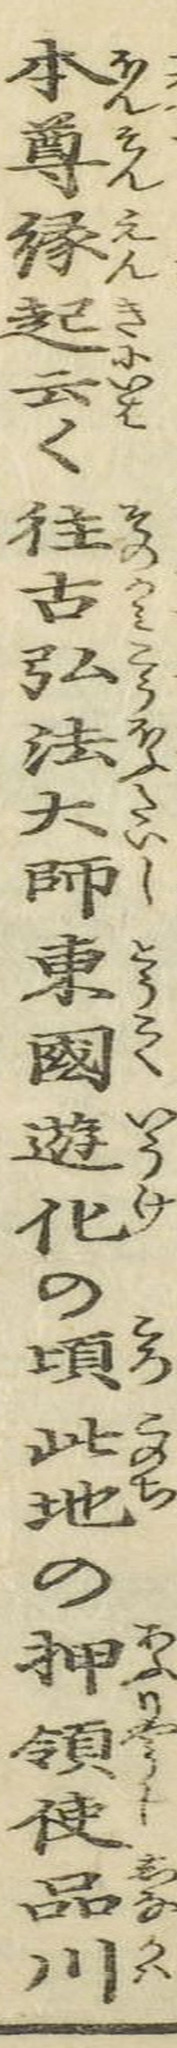本尊縁起云く往古弘法大師東國遊化の頃此地の押領使品川
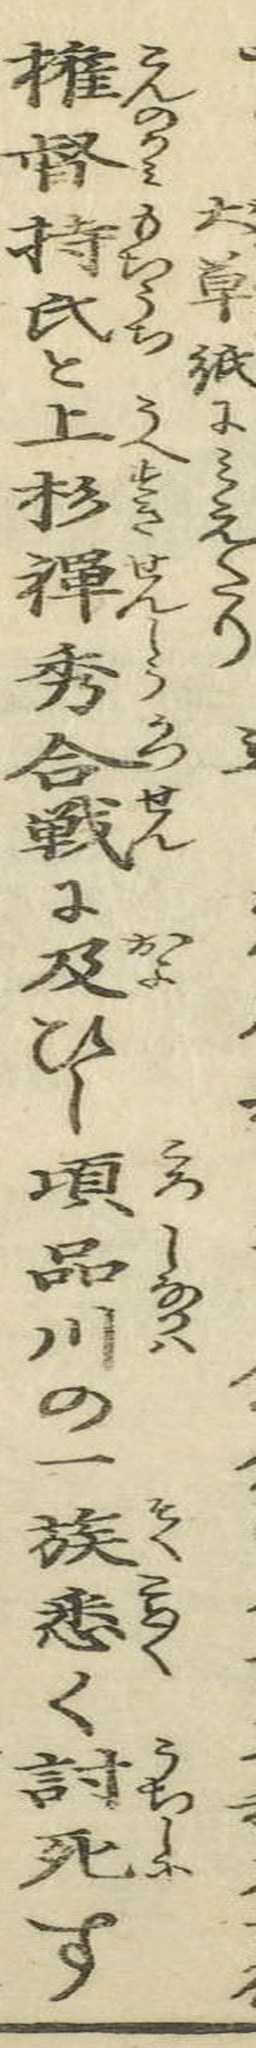権督持氏と上杉禪秀合戦に及ひし頃品川の一族悉く討死す
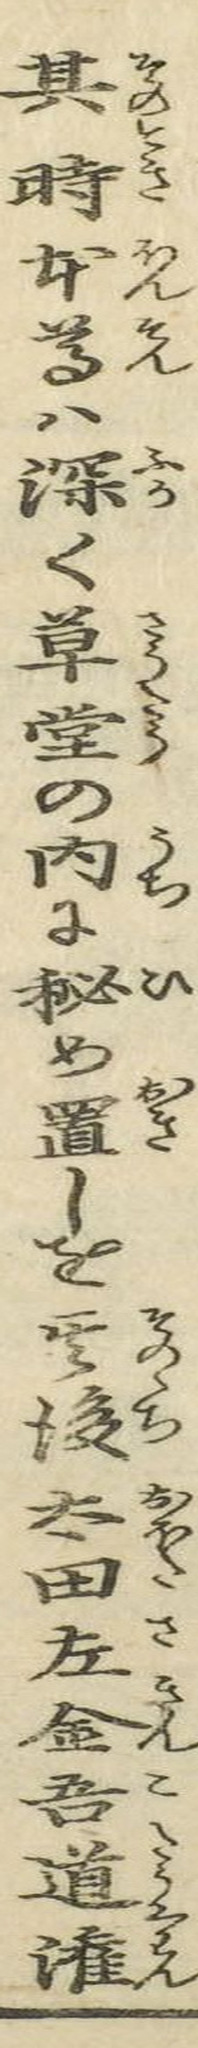其時本尊は深く草堂の内に秘め置しを其後太田左金吾道灌
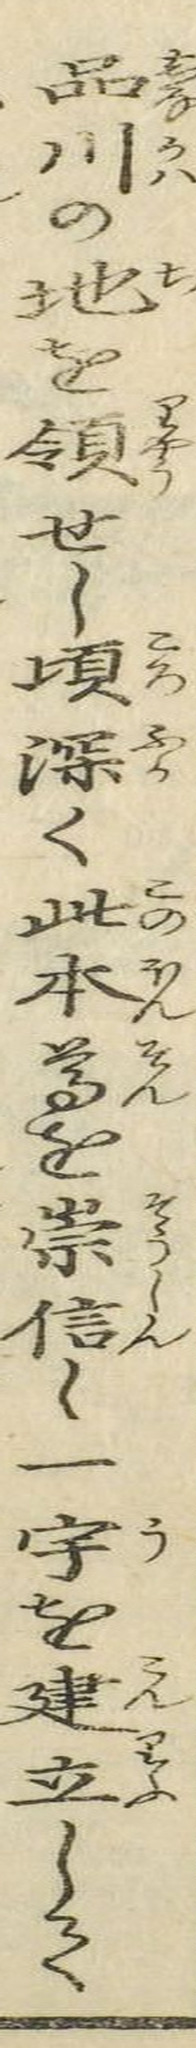品川の地を領せし頃深く此本尊を崇信し一宇を建立して
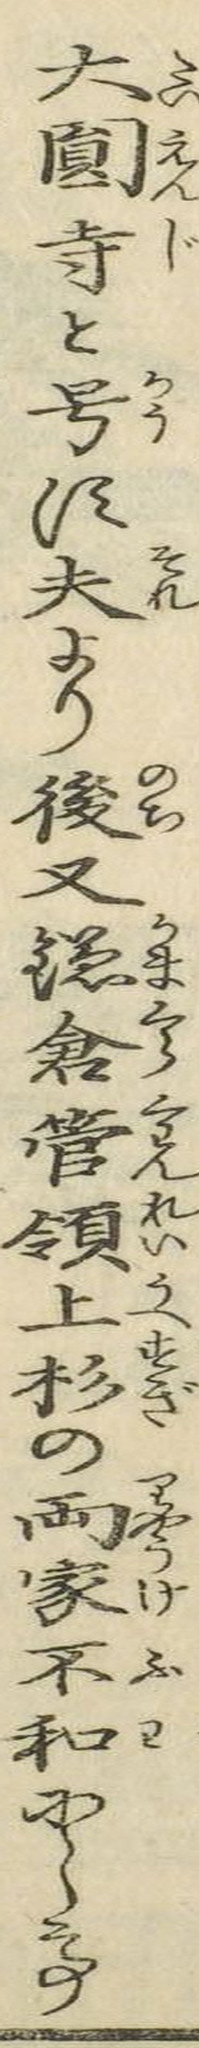大圓寺と号す夫より後又鎌倉管領上杉の両家不和にして
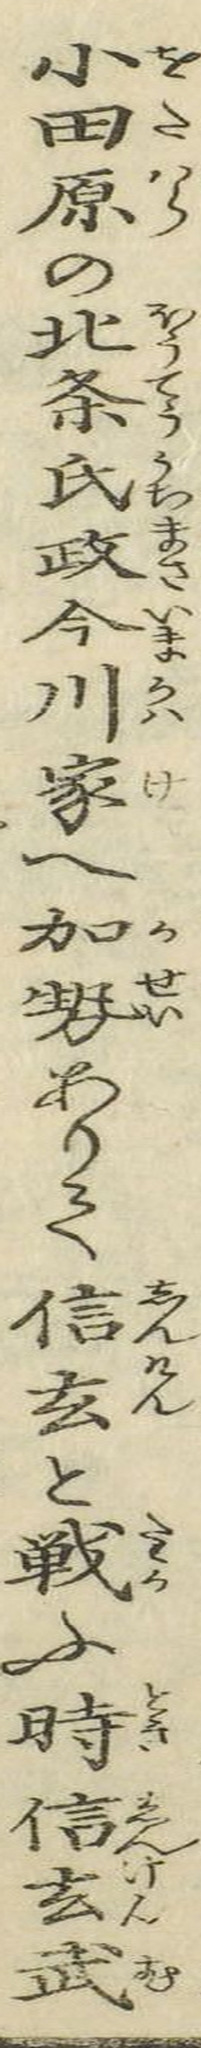小田原の北条氏政今川家へ加勢ありて信玄と戦ふ時信玄武
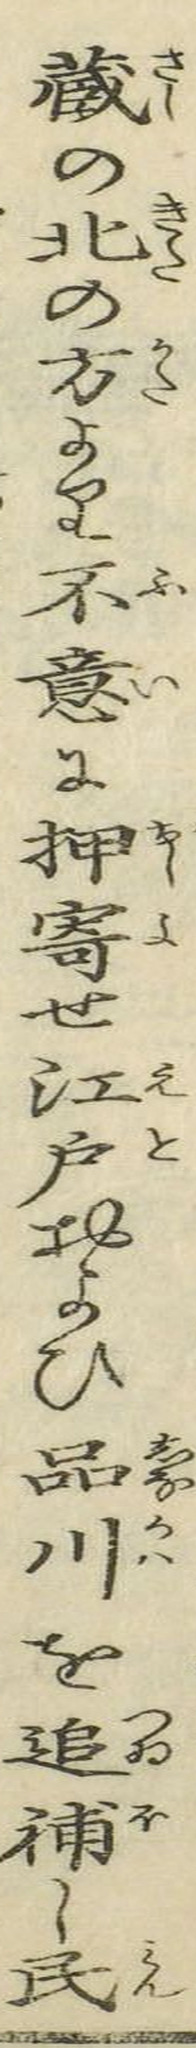藏の北の方より不意に押寄せ江戸およひ品川を追補し民
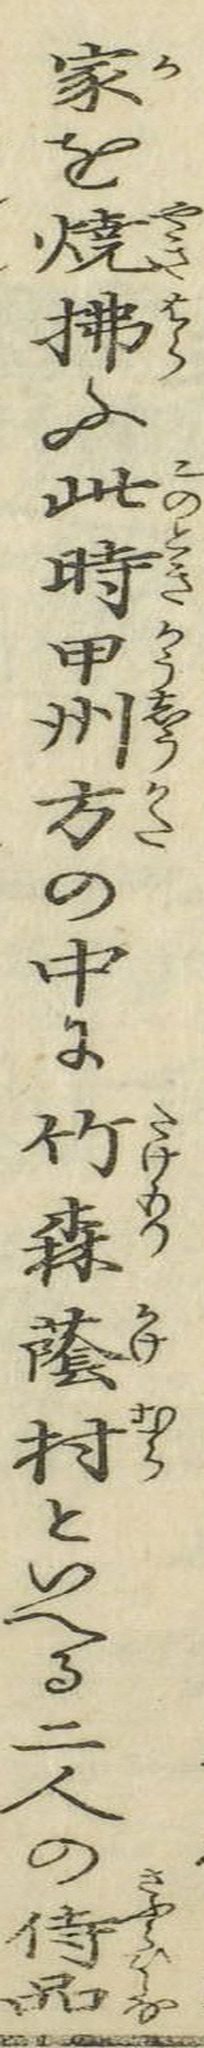家を焼拂ふ此時甲州方の中に竹森蔭村といへる二人の侍品
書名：江戸名所図会 20巻 巻之4
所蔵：東京学芸大学教育コンテンツアーカイブ
